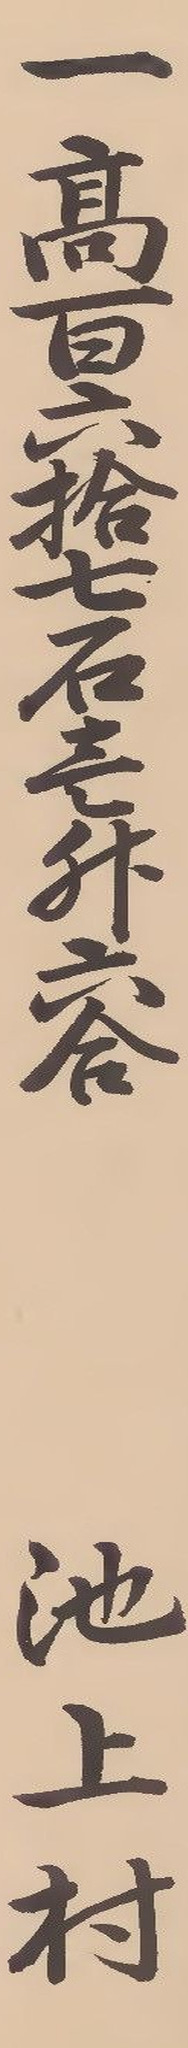一高百六拾七石壱升六合池上村
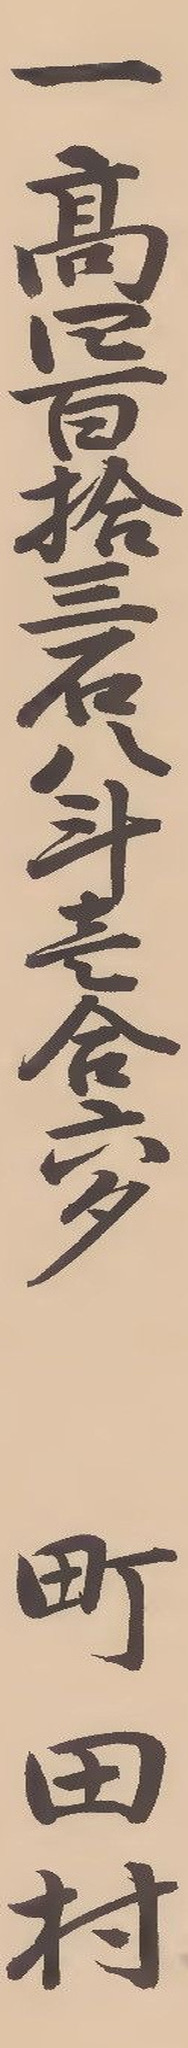一高四百拾三石八斗壱合六勺町田村
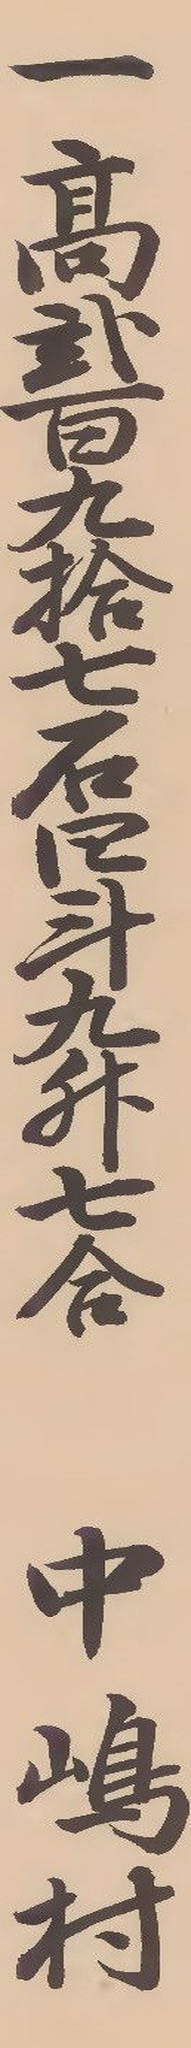一高弐百九拾七石四斗九升七合中嶋村
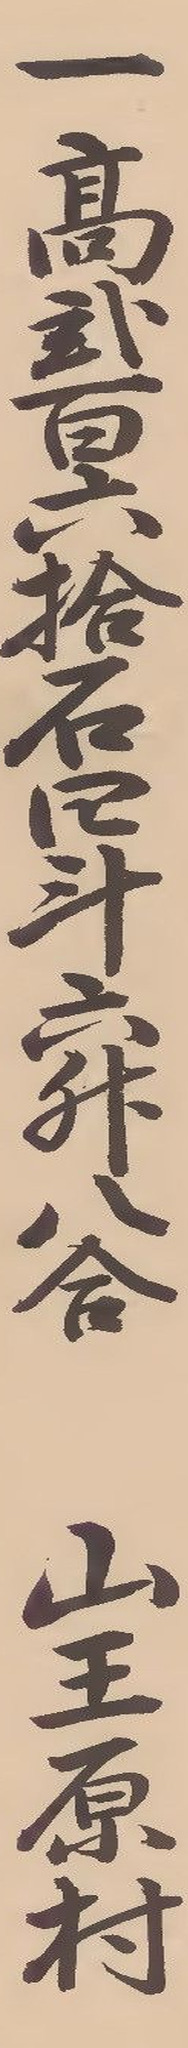一高弐百六拾石四斗六升八合山王原村

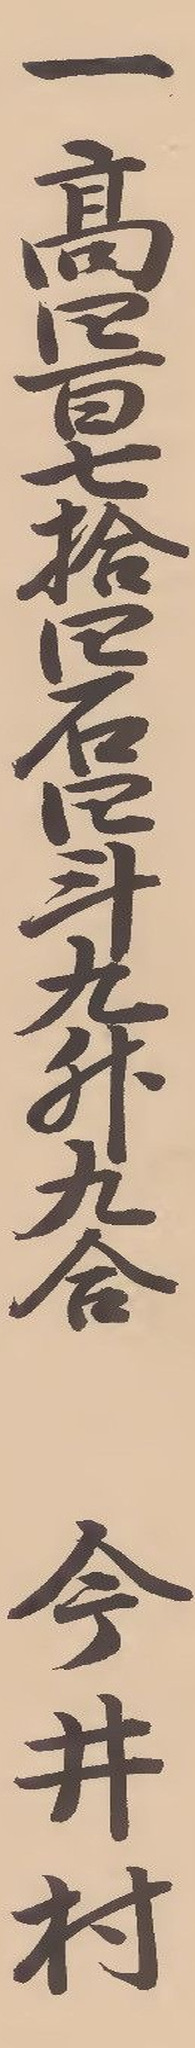一高四百七拾四石四斗九升九合今井村
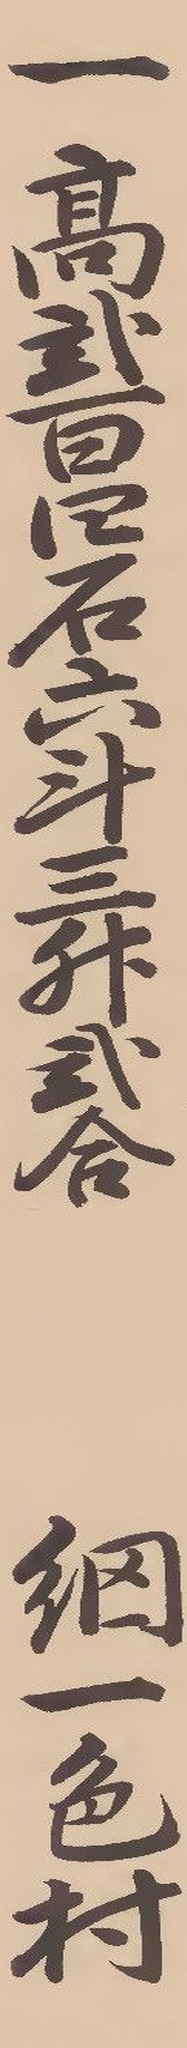一高弐百四石六斗三升弐合網一色村
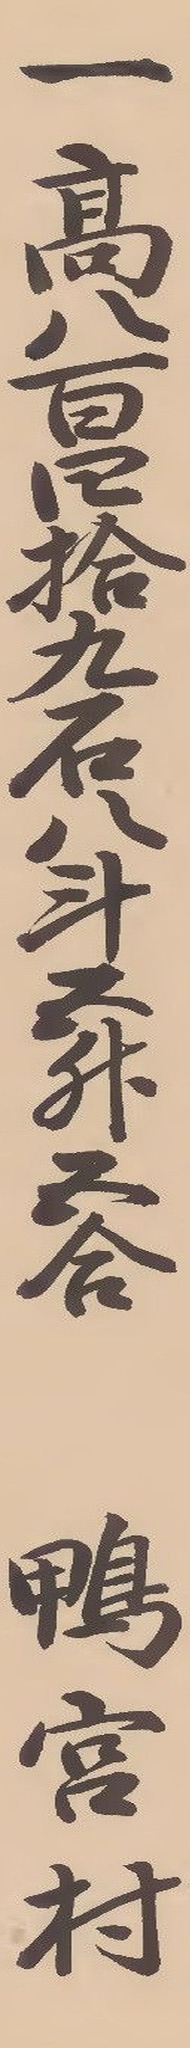一高八百四拾九石八斗五升五合鴨宮村
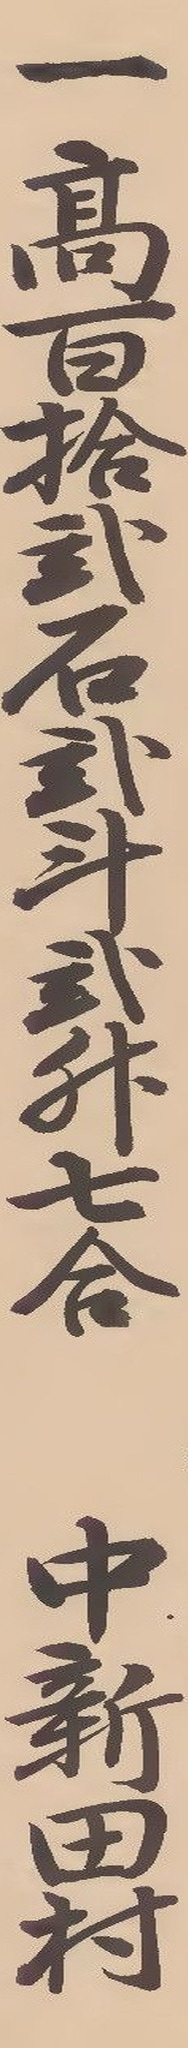一高百拾弐石弐斗弐升七合中新田村
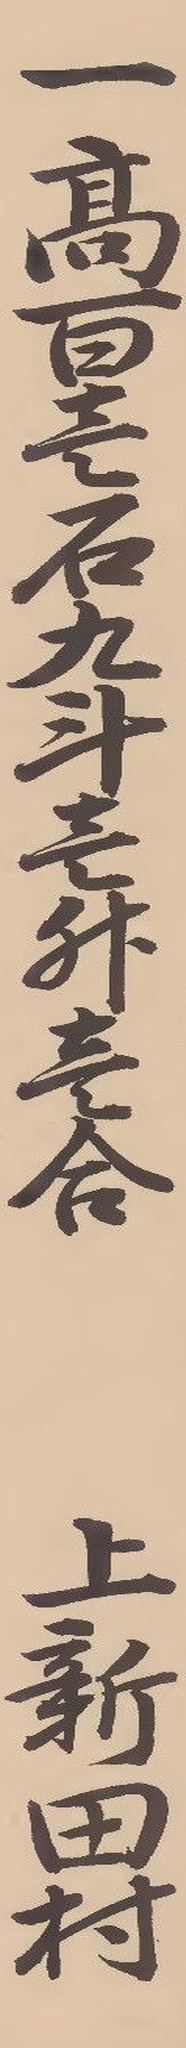一高百壱石九斗壱升壱合上新田村
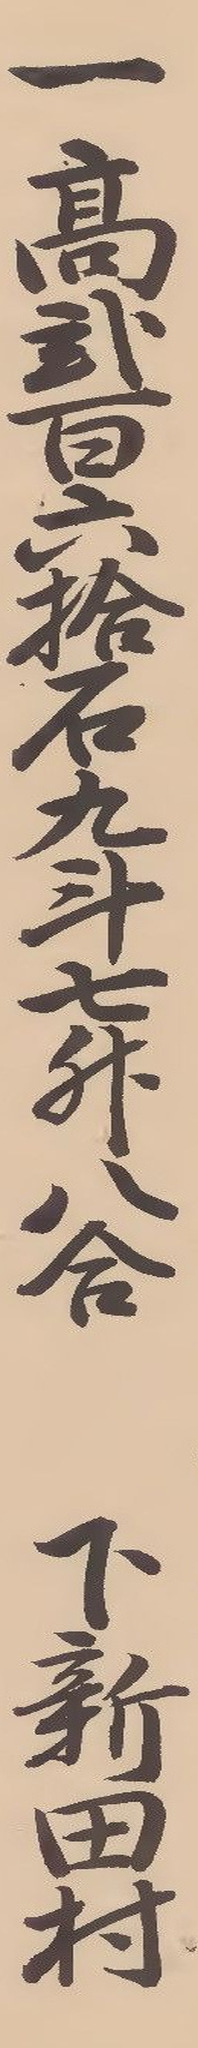一高弐百六拾石九斗七升八合下新田村
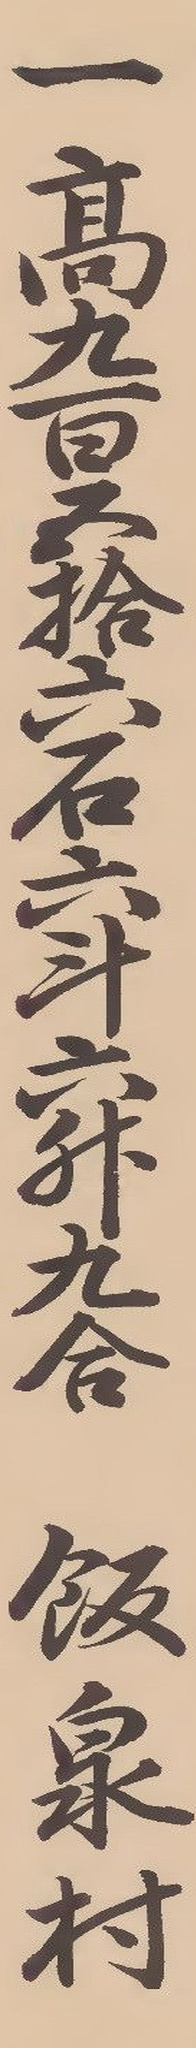一高九百五拾六石六斗六升九合飯泉村
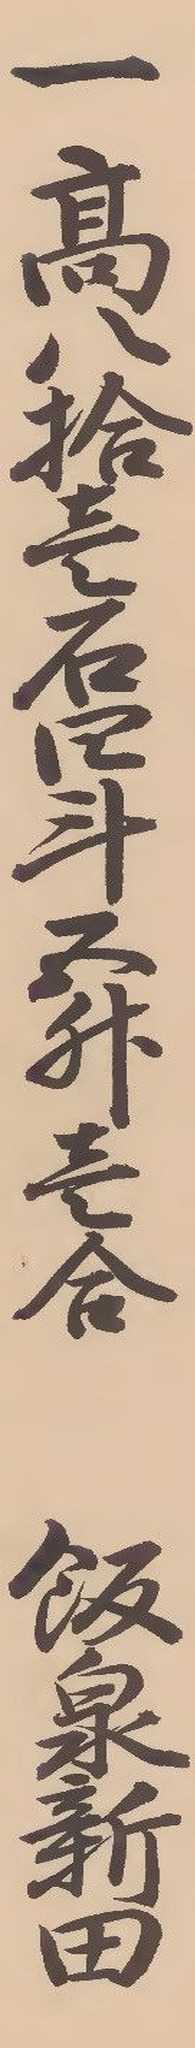一高八拾壱石四斗五升壱合飯泉新田

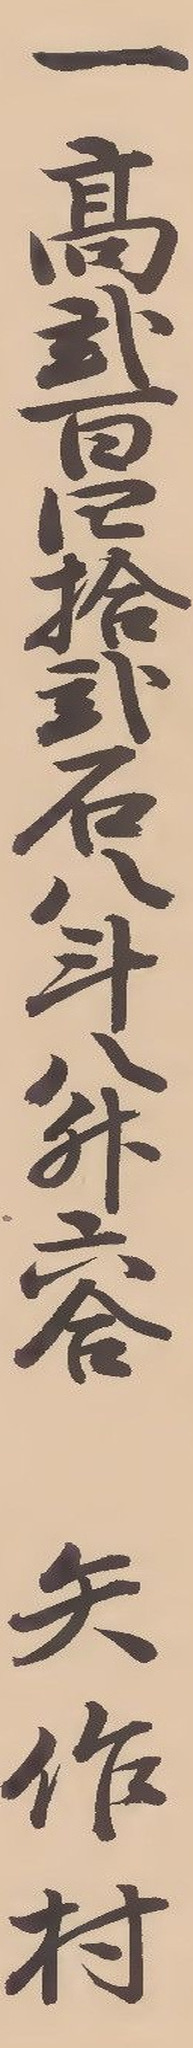一高弐百四拾弐石八斗八升六合矢作村
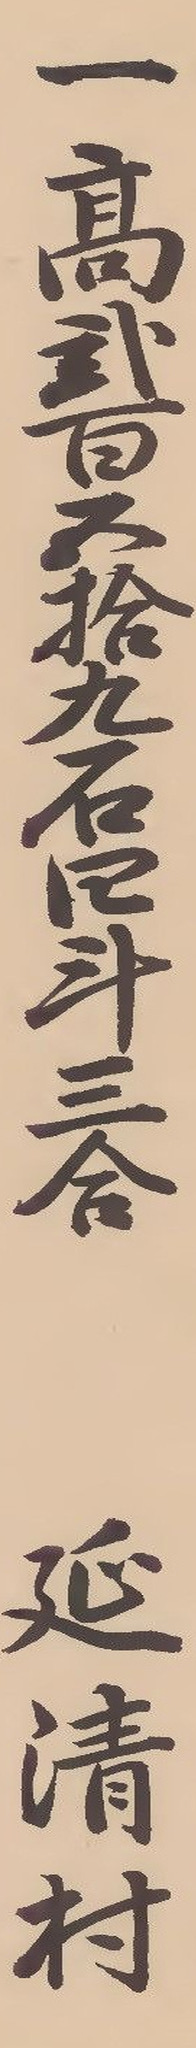一高弐百五拾九石四斗三合延清村
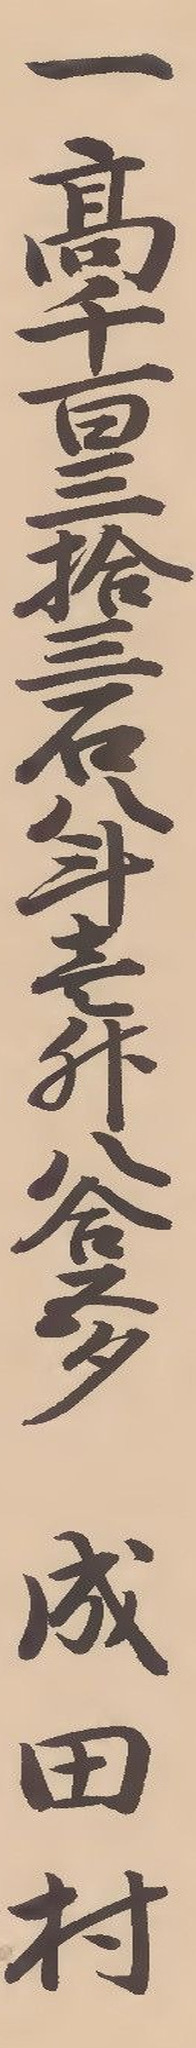一高千百三拾三石八斗壱升八合五勺成田村
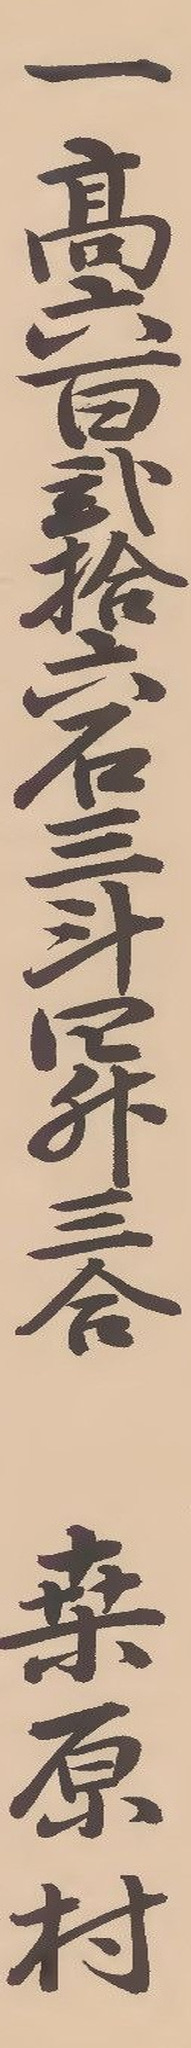一高六百弐拾六石三斗四升三合桑原村
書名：相模国郷帳
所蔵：国立公文書館 National Archives of Japan
